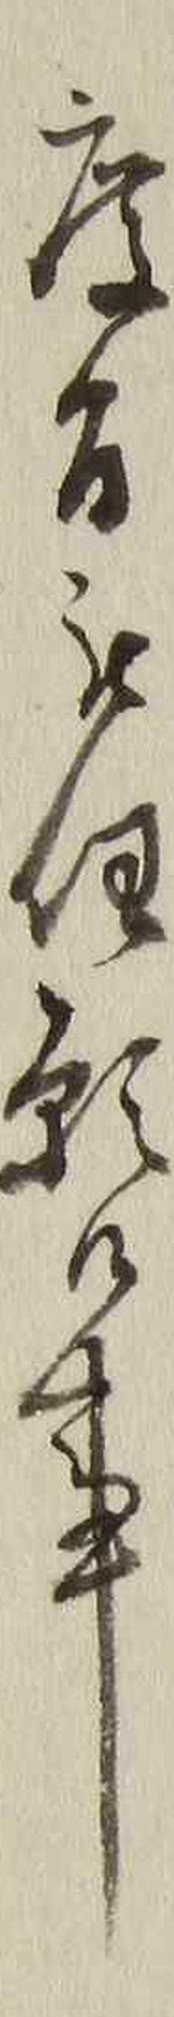度旨被任願候事
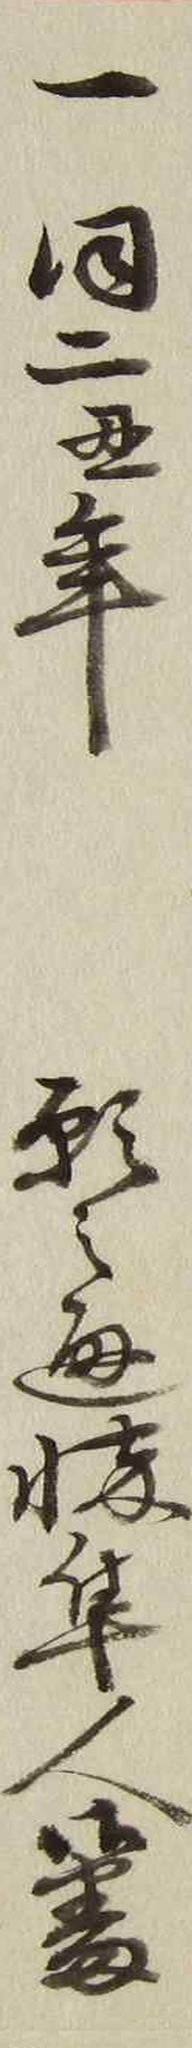一同二丑年願之通悴隼人御番
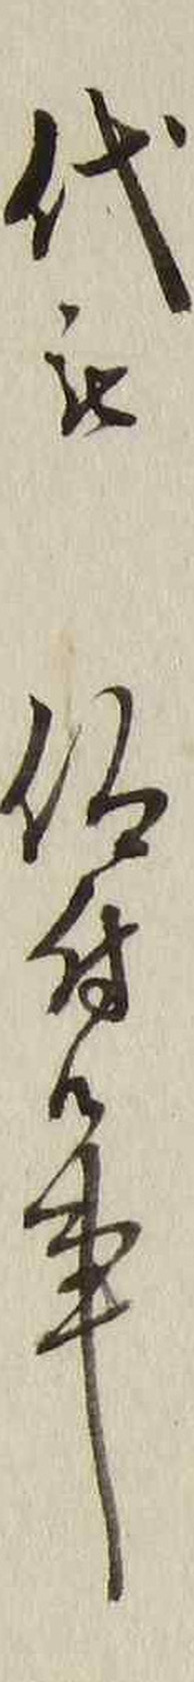代被仰付候事
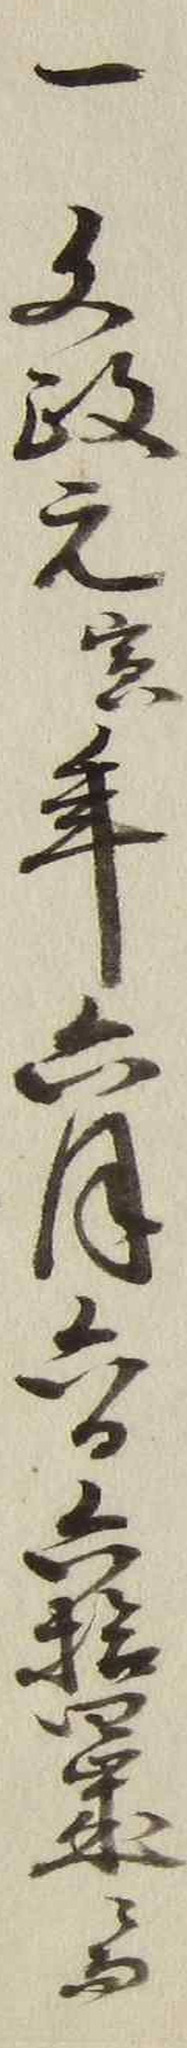一文政元寅年六月六日六拾四歳ニ而
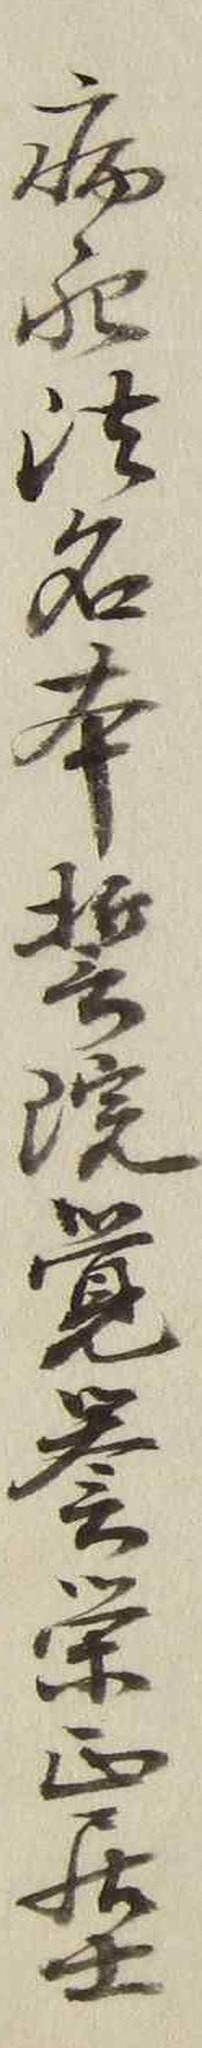病死法名本誓院覚誉栄正居士

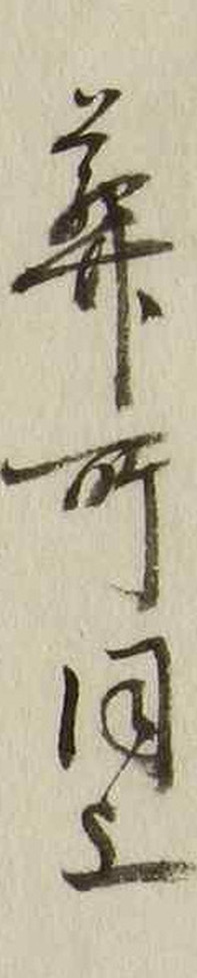葬所同上
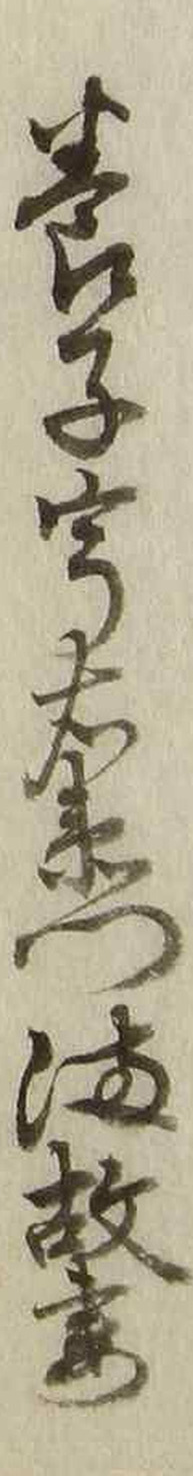女養子宇右衛門満故妻
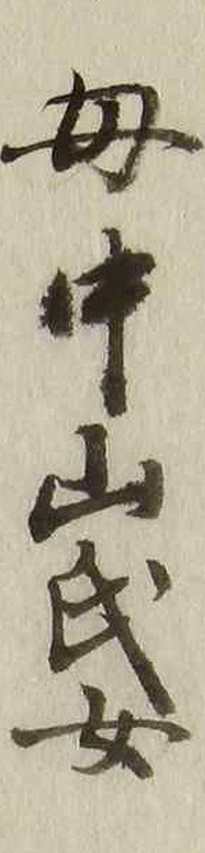母中山氏女
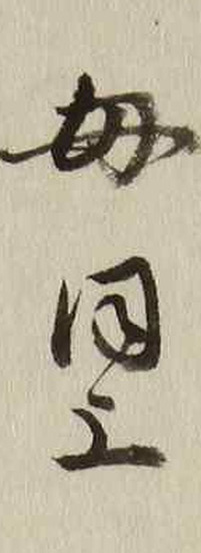母同上
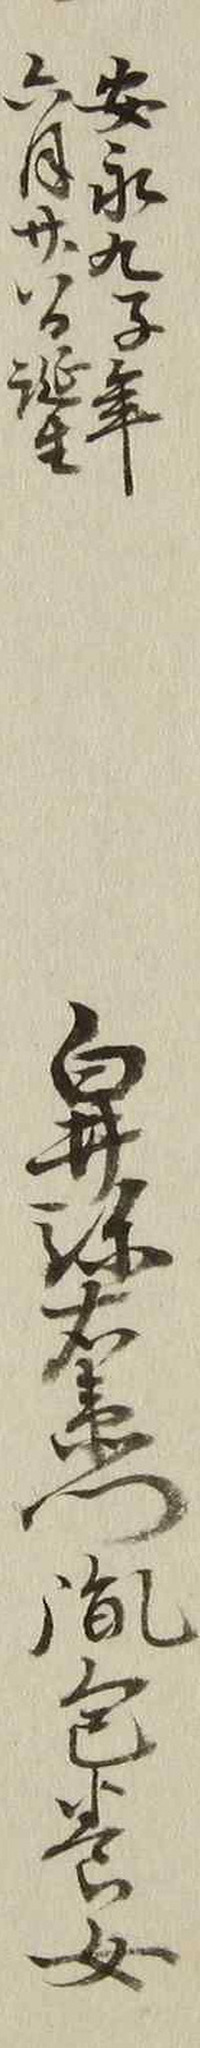六月廿八日誕生白井弥右衛門胤包養女
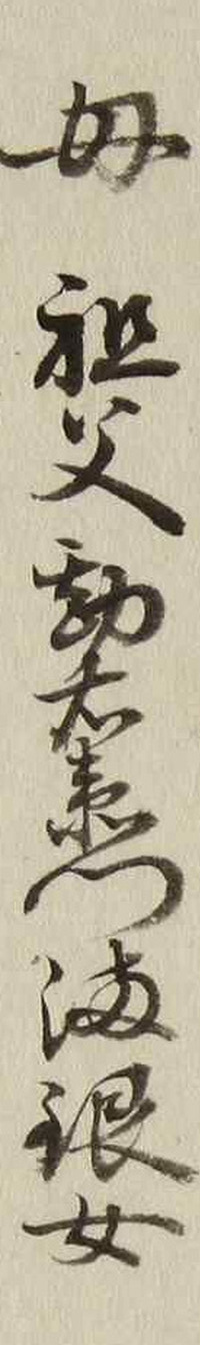母祖父勘右衛門満銀女
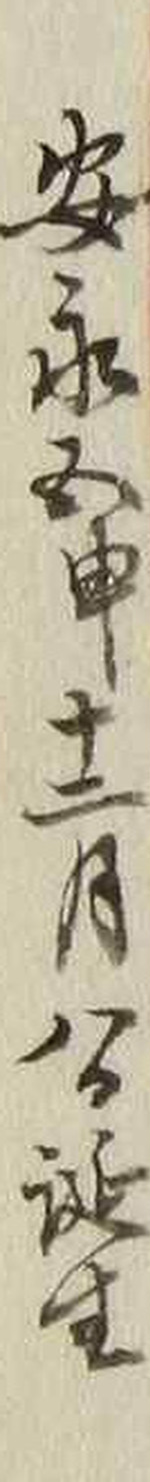安永五申十二月八日誕生
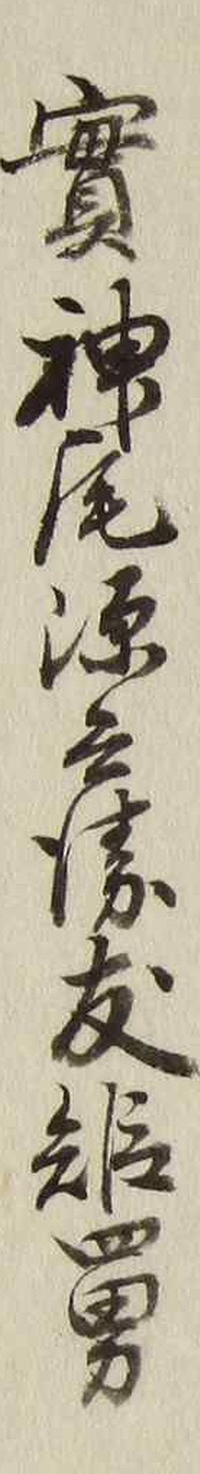実神尾源兵衛友矩四男
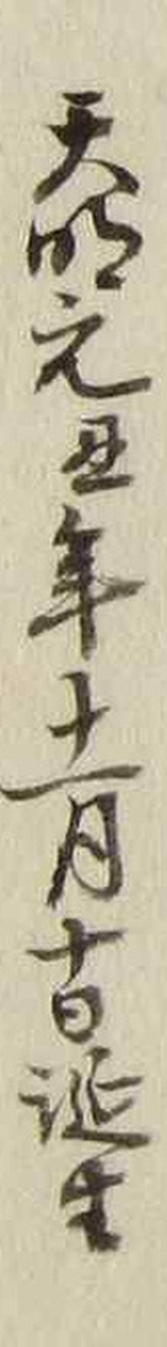天明元丑年十一月十日誕生

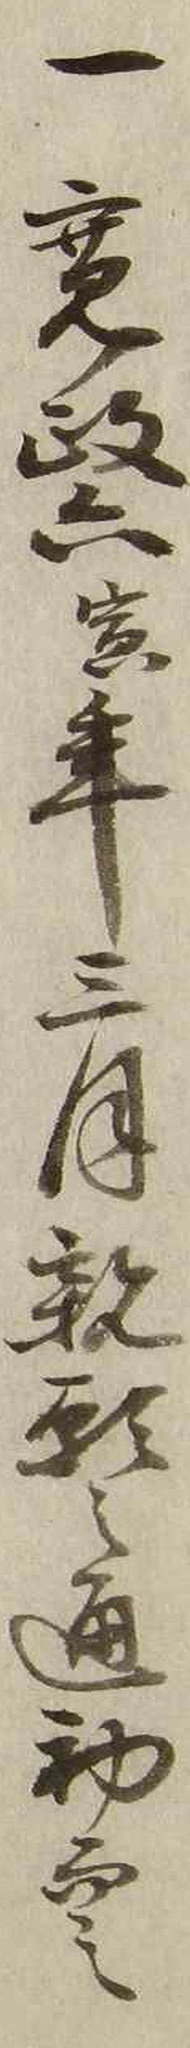一寛政六寅年三月親願之通初而之
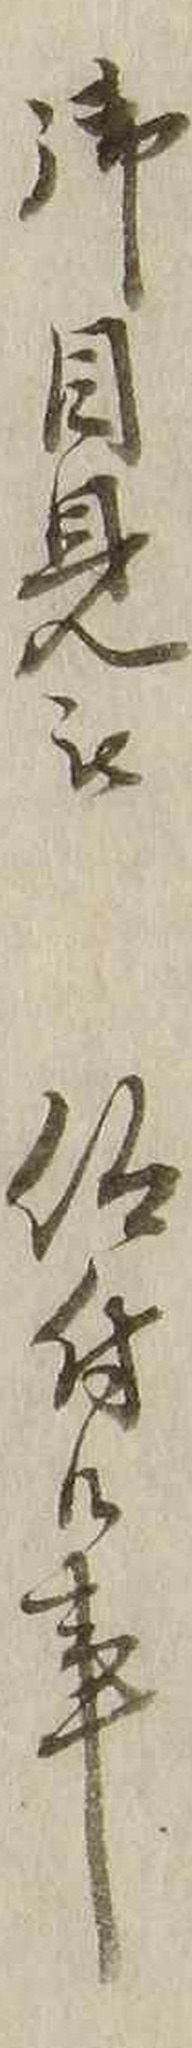御目見被仰付候事
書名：諸士系譜　巻之27　い之部27
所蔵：会津若松市立会津図書館
